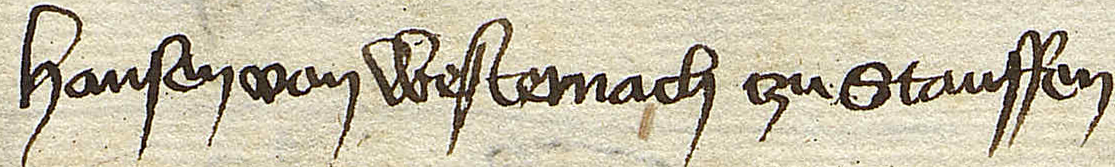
Hanſen von Weſternach cʒu Stauffen
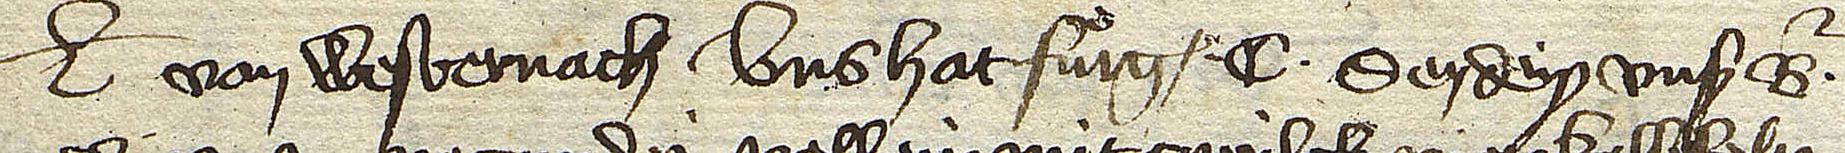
L* von Weſternach / Vns hat fürg* . C . Seydein vnſ* B* .
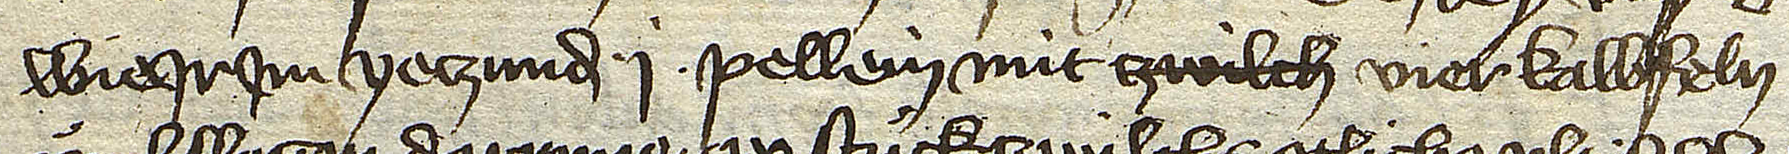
wie Ir Im yecʒund* . i . pellein mit cʒwilch vier kalbfeln
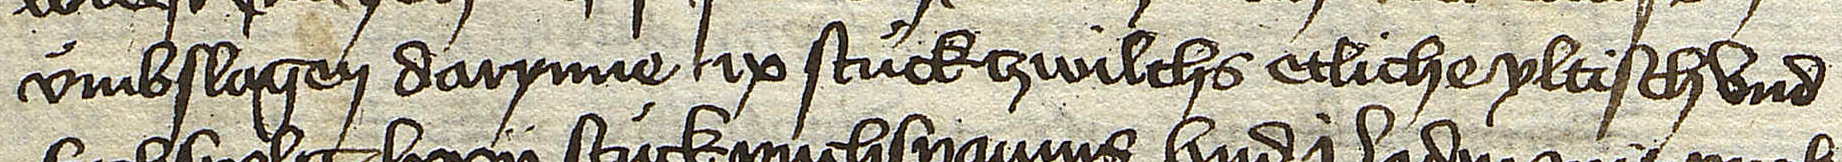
v̈mbſlagen darynne . ix ſtück cʒwilchs etliche yltiſch vnd
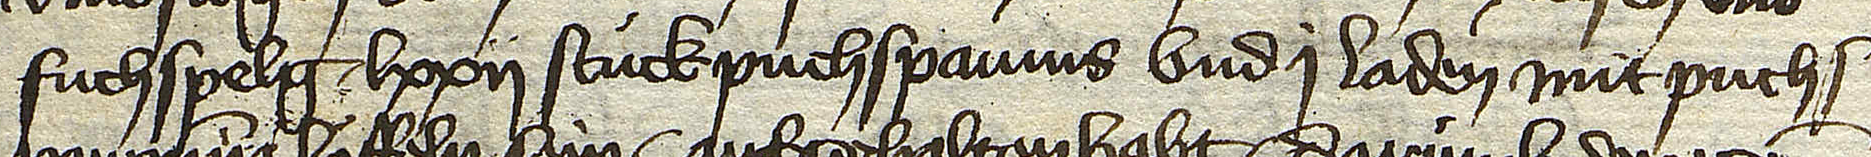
fuchſpelg / lxxii ſtück puchſpaums vnd i laden mit puchſ
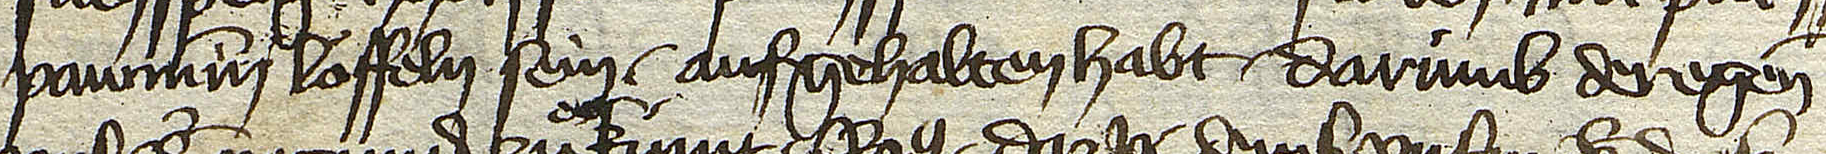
pawm*in löffeln ſein / aufgehalten habt / darümb der egen*
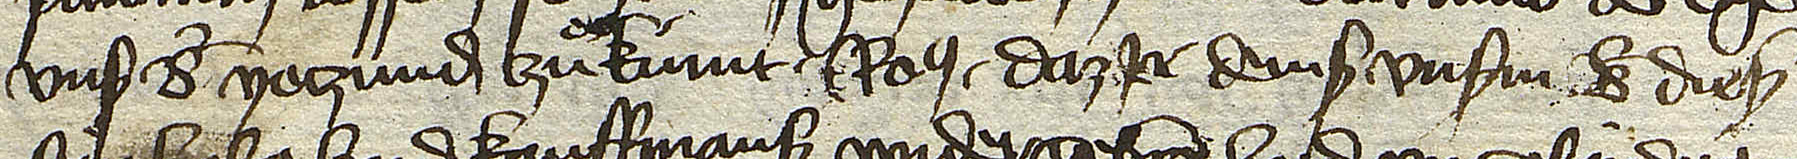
vnſ* B* yecʒund* cʒu kümt . Ro* / daʒ Ir demſ* vnſ*m B* dieſ*
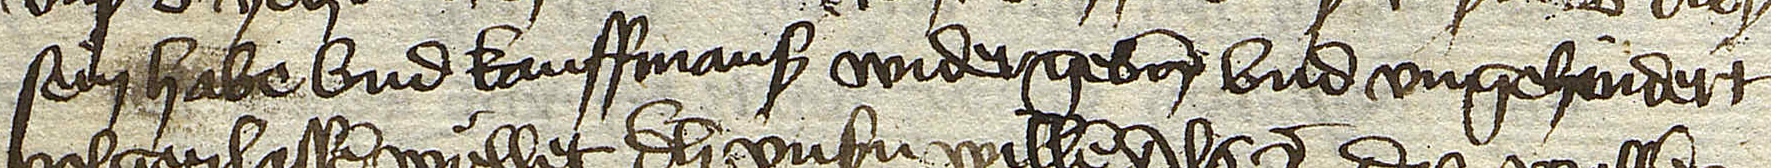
ſein habe vnd kauffmanſ* widergeb*n vnd vngehindert
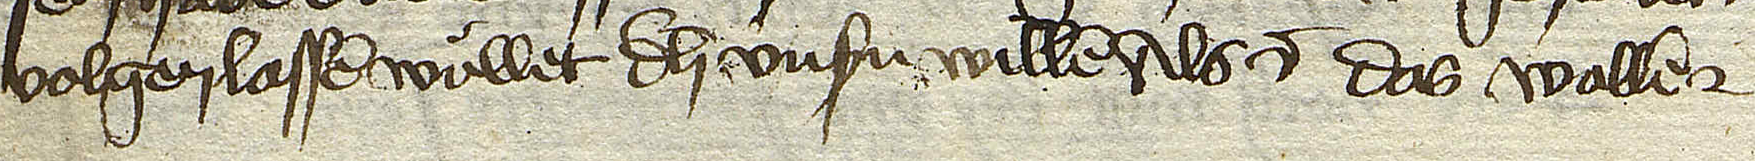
volgen laſſe* wöllet d*h* vnſ*n wille* Als ec* das wolle* ec*
